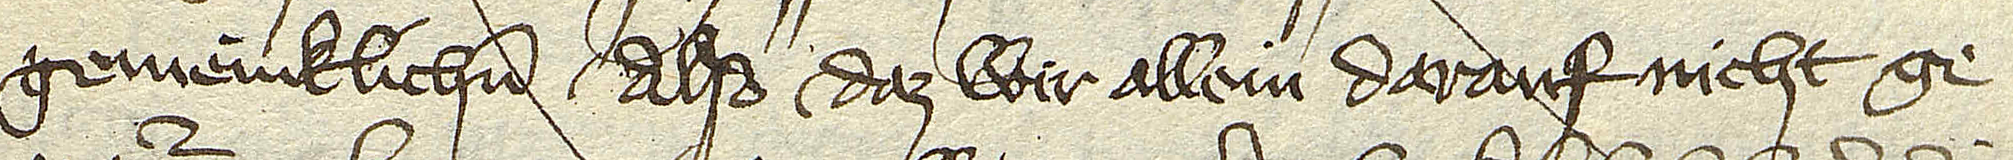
gemeinklichn* / Alſo / daʒ wir allein darauf nicht ge
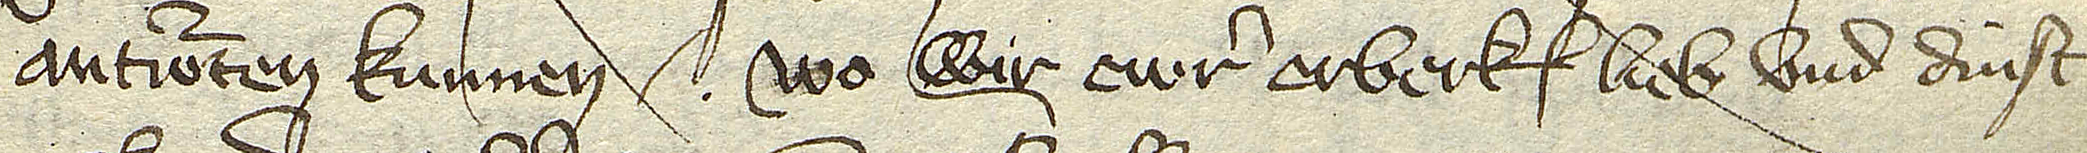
antwt*en kunnen / . wo wir ewr* erberk* lieb vnd dinſt
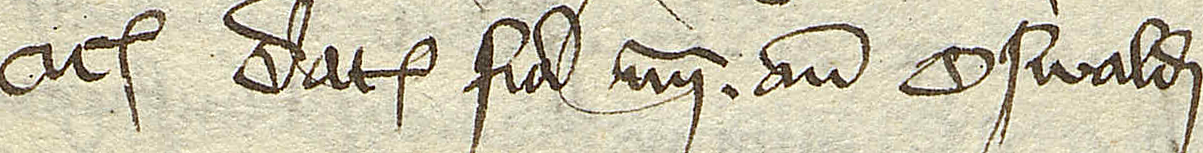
ec* Dat* fia* iiii* . an* Oſwald
